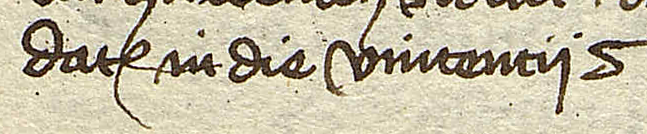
dat* in die vincencii* §
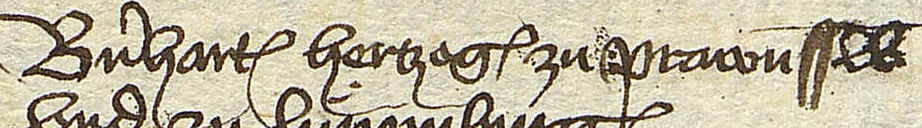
Bn*hart* hertʒog* cʒu Prawnſſw*
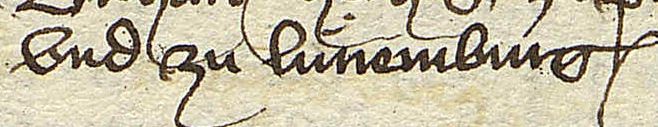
vnd cʒu lünemburg
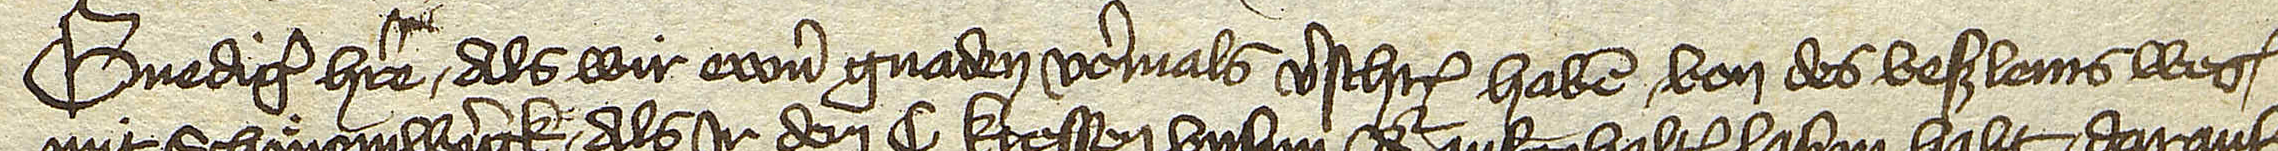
Gnedig* h*re / Als wir ewn* gnaden vo*mals v*ſchr* habe* / von des veſʒleins weg*
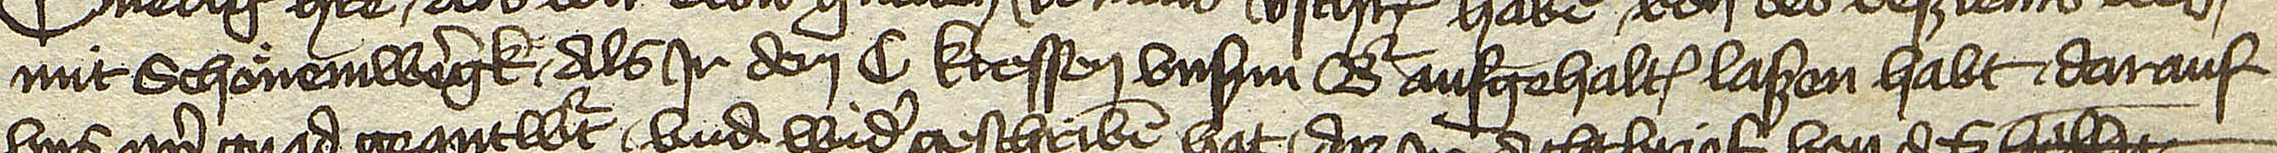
mit Schönemwegk* / Als Ir dem C Kreſſen vnſ*m B* aufgehalt* laſʒen habt / darauf
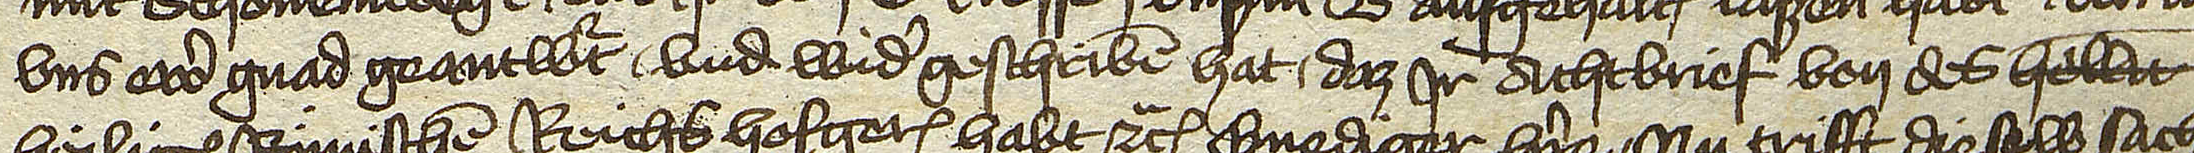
vns ew* gnad geantw*t / vnd wid* geſchribe* hat / daʒ Ir Achtbrief von des hellu*
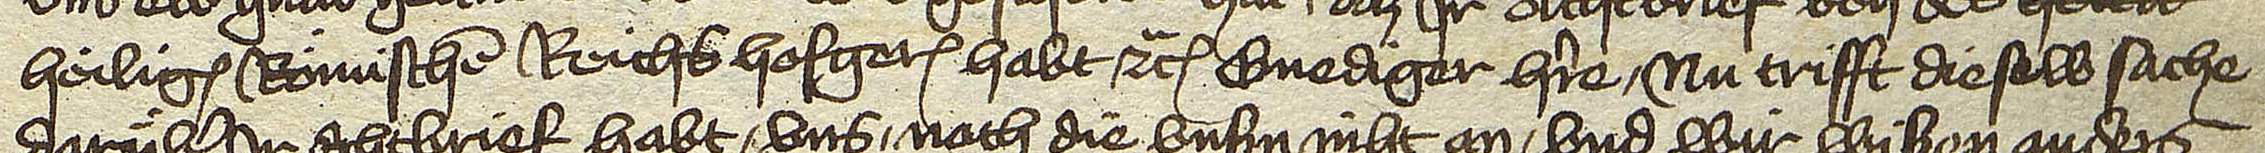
heilig* Römiſche* Reichs hofger* habt ec* Gnediger h*re / Nu trifft dieſelb ſache
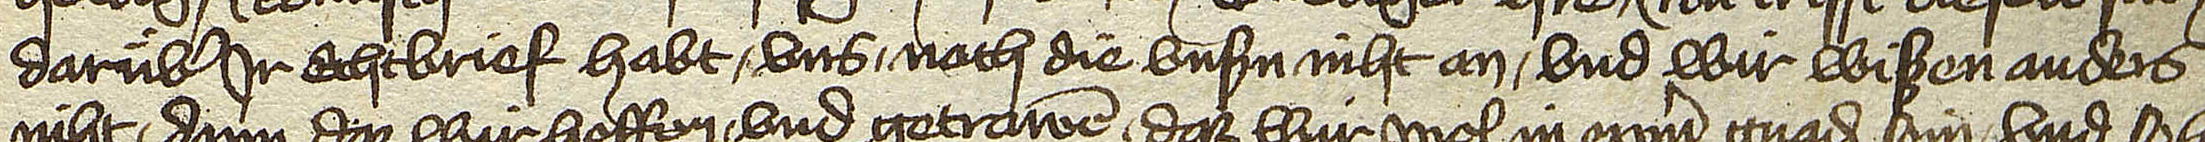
darüb* Ir Achtbrief habt / vns / noch die vnſ*n niht an / vnd wir wiſʒen anders
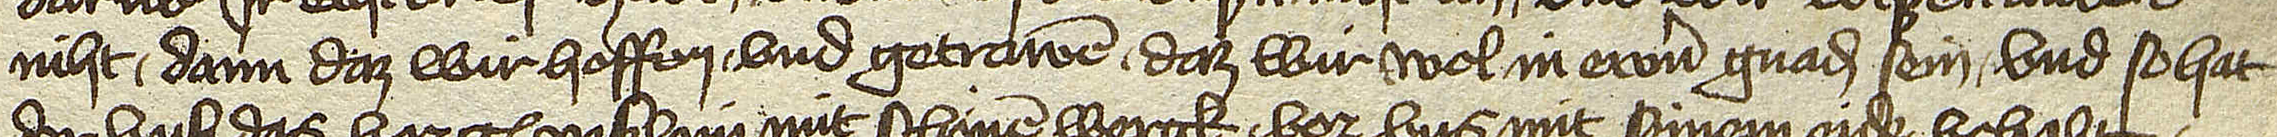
niht / dann daʒ wir hoffen / vnd getrawe* / daʒ wir wol in ewn* gnad* ſein / vnd ſo hat
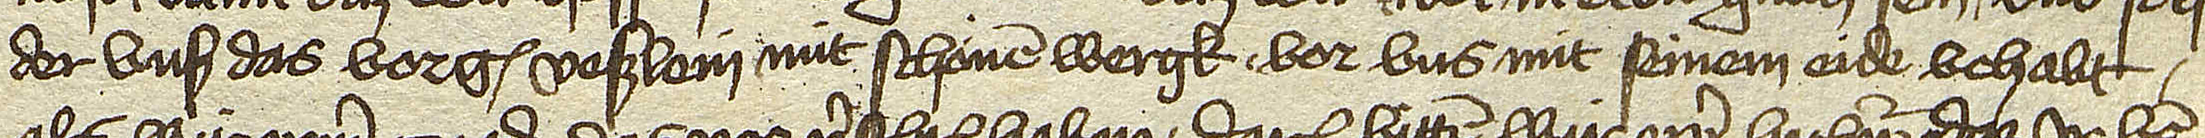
der vnſ* das vorg* veſʒlein mit ſchöne* wergk* / vor vns mit ſeinem eide behabt /
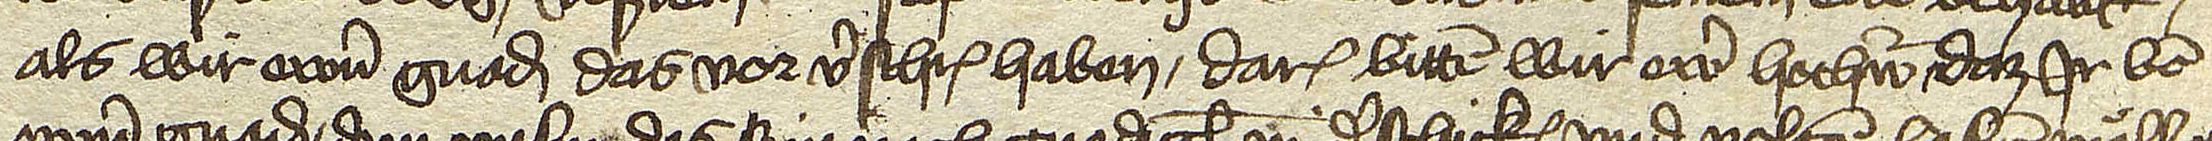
als wir ewn* gnad* das vor v*ſchr* haben / dar* bitte* wir ew* hochw* / daʒ Ir vo*
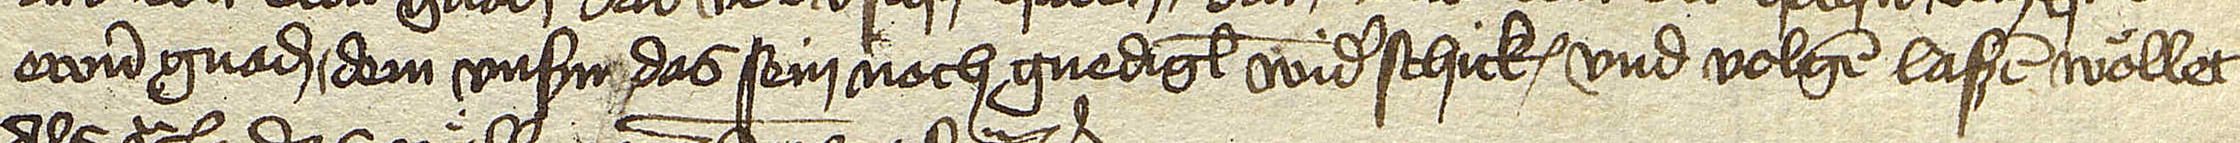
ewn* gnad* / dem vnſ*n das ſein noch gnedigl* wid*ſchick* vnd volge* laſʒe* wöllet
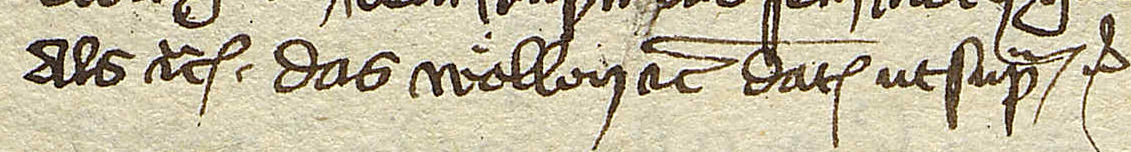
Als ec* / das wöllen ec* dat* eu ſup / §
